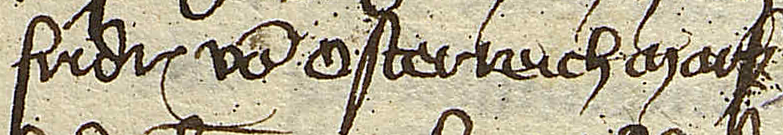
fridr* vo* Öſterreich Marſ*
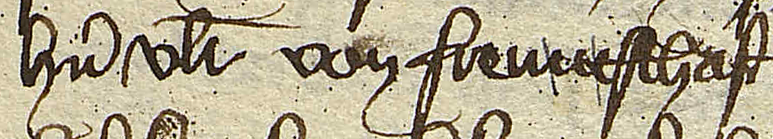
hn* vlr* von freuntſchaft
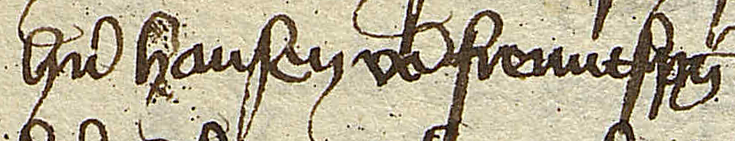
hn* hanſen vo freuntſpg*
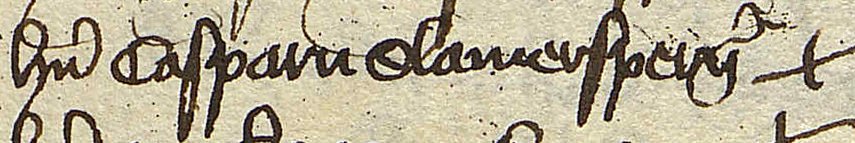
hn* Caſparn Slamerſperg*
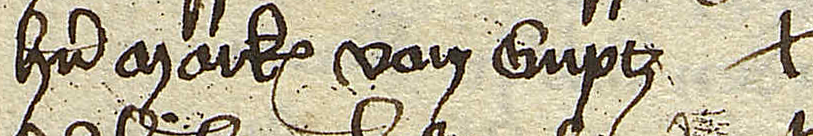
hn* Mark* von Empcʒ
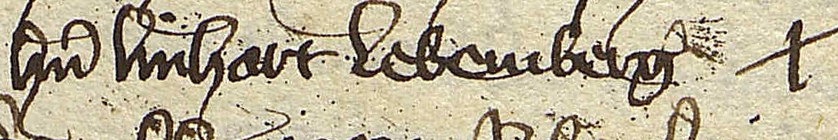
hn* linhart lebemberg*
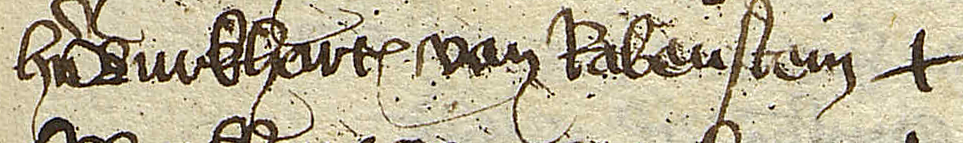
hn* Burkhart* von Rabenſtein
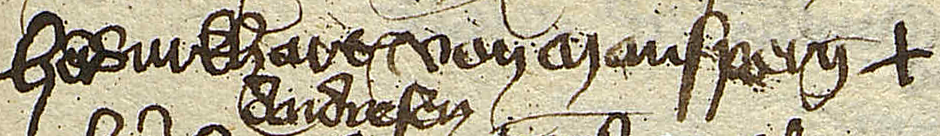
her Burkhart* von Mauſperg
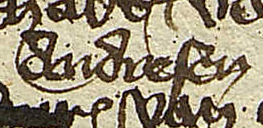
Andreſen
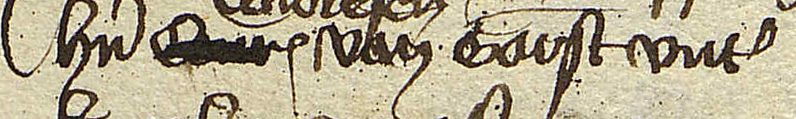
hn* Conr* von Garſt vnt*
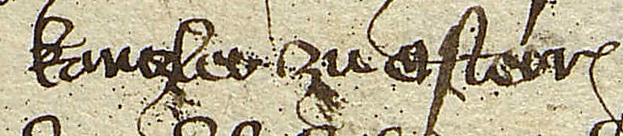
kancʒler cʒu Oſterr*
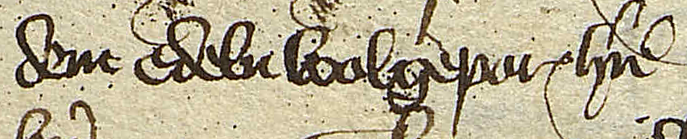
dem edeln wolgepor* h*re*
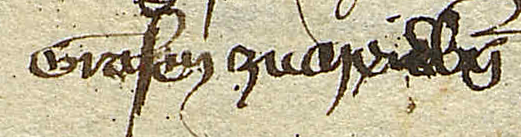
Grafen cʒu Meidb*g
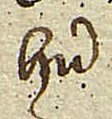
hn*
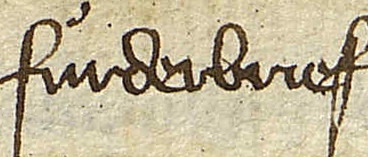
fürderbrief
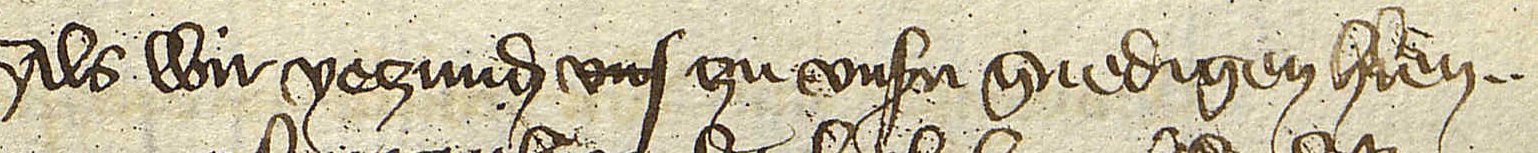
Als wir yecʒund* vnſ cʒu vnſ*n gnedigen hr*en ~
